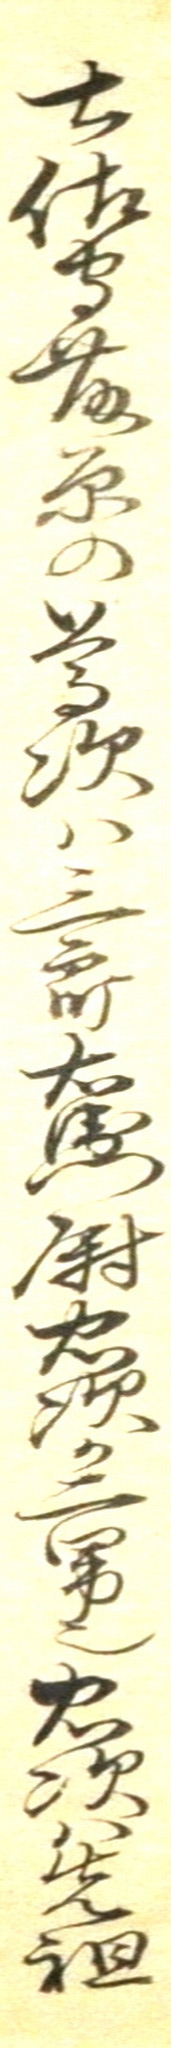土佐守藤原の尊次は三郎右衛門尉忠次か二男也忠次は先祖
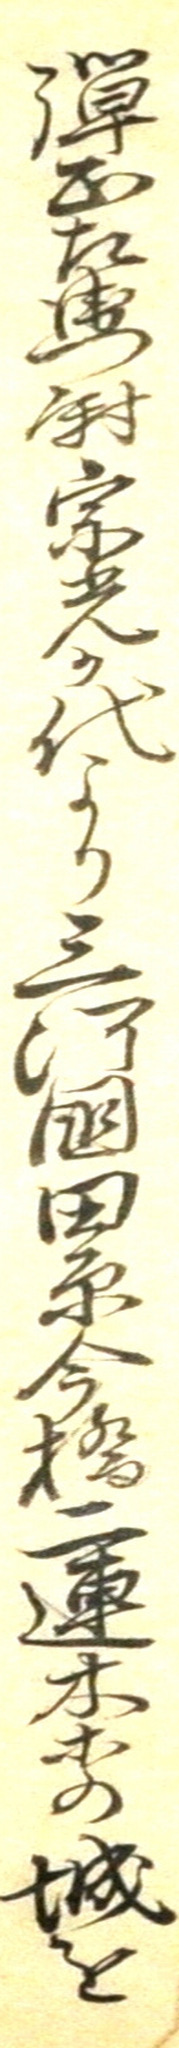弾正左衛門尉宗光か代より三河国田原今橋二連木等の城を
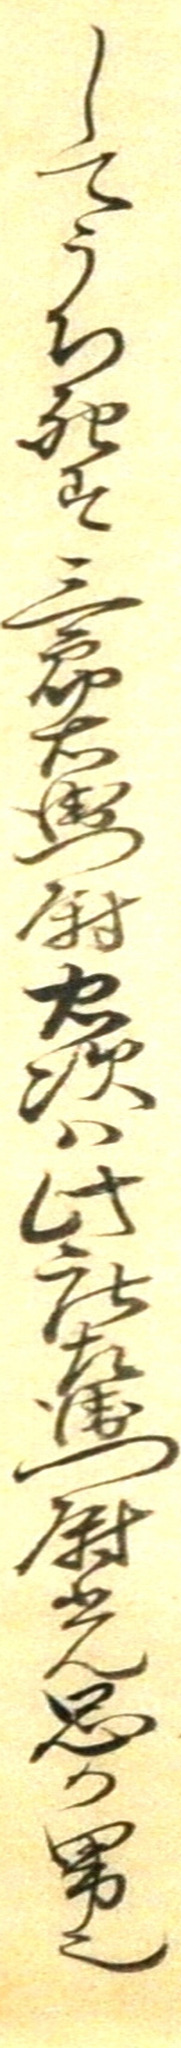してうち死す三郎右衛門尉忠次は此庄左衛門尉光忠か男也
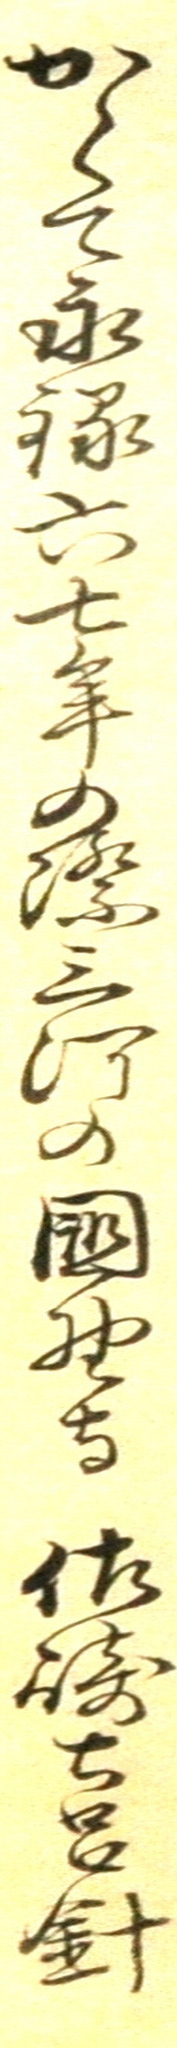かくて永禄六七年の際三河の国野寺佐崎土呂針

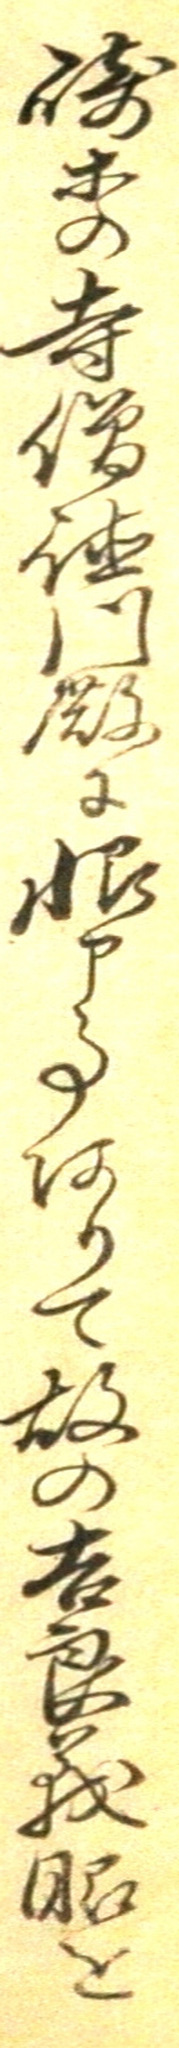崎等の寺僧徳川殿に恨申事ありて故の吉良義昭を
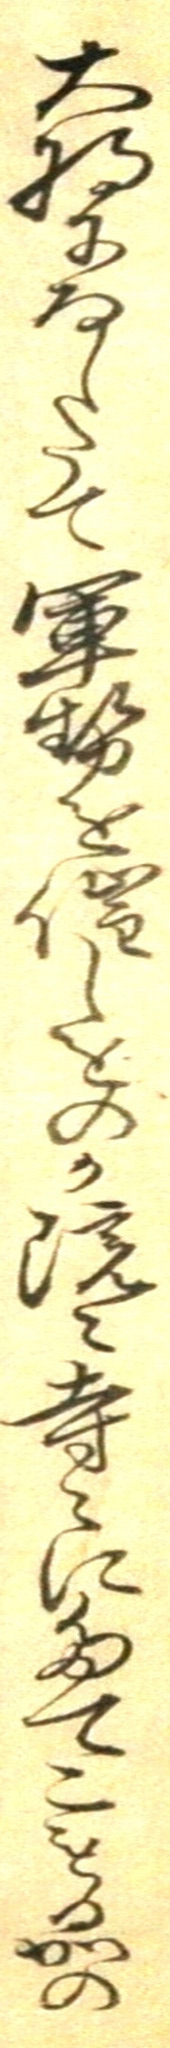大将になしたて軍勢を催しをのか院々寺々にたてこもるかの
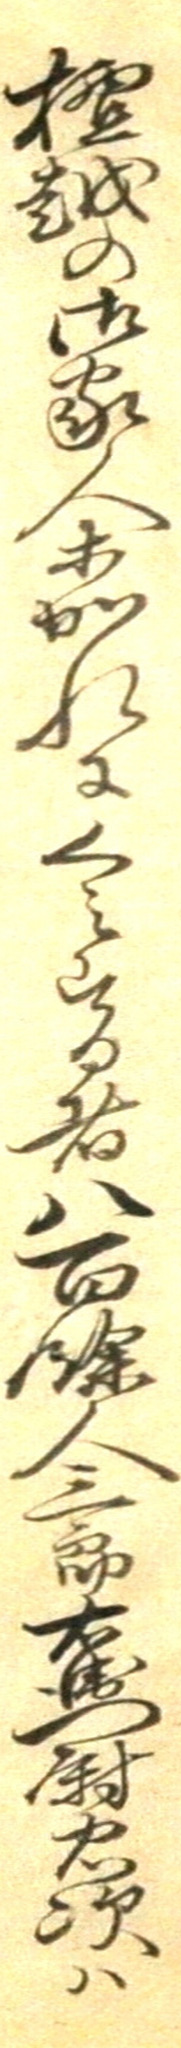檀越のごけに御家人等かれにくみする者八百余人三郎右衛門尉忠次は
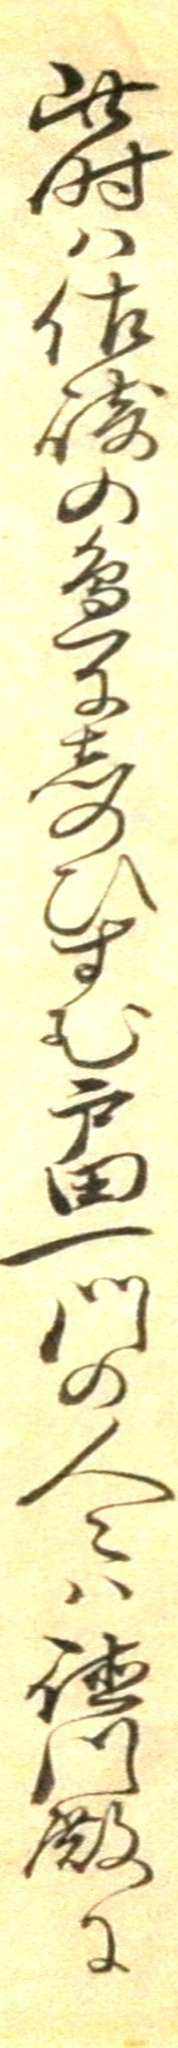此時は佐崎の辺にしのひすむ戸田一門の人々は徳川殿に
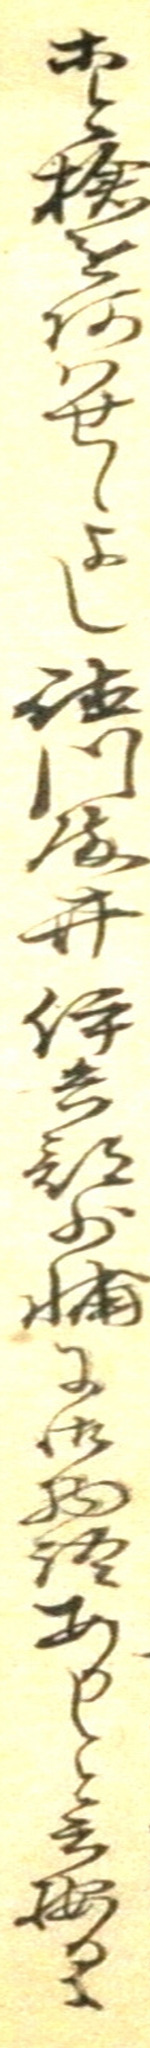等と槍をあわせしよし徳川殿井伊兵部少輔に御物語ありしと云按るに
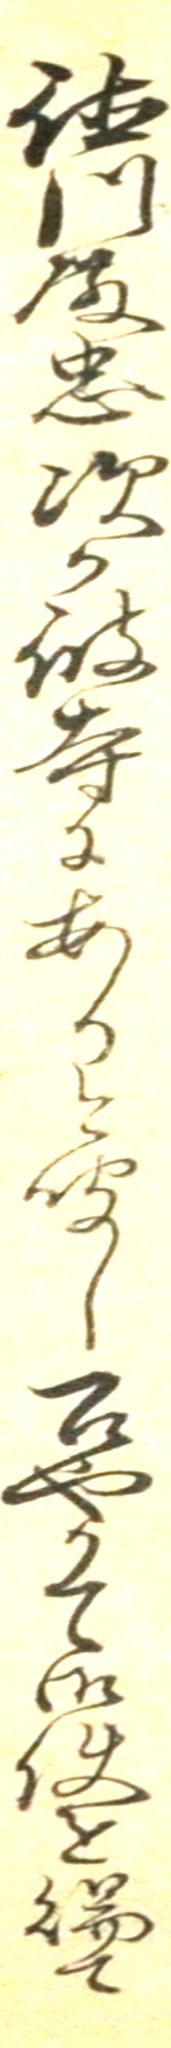徳川殿忠次か彼寺にありと聞し召やかて御使を賜て
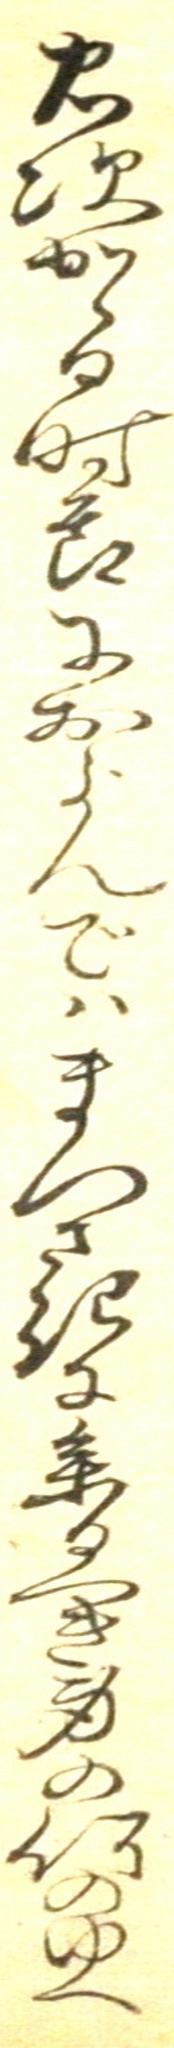忠次かゝる時節におよんではまつさきに参るへき身の何のゆへ
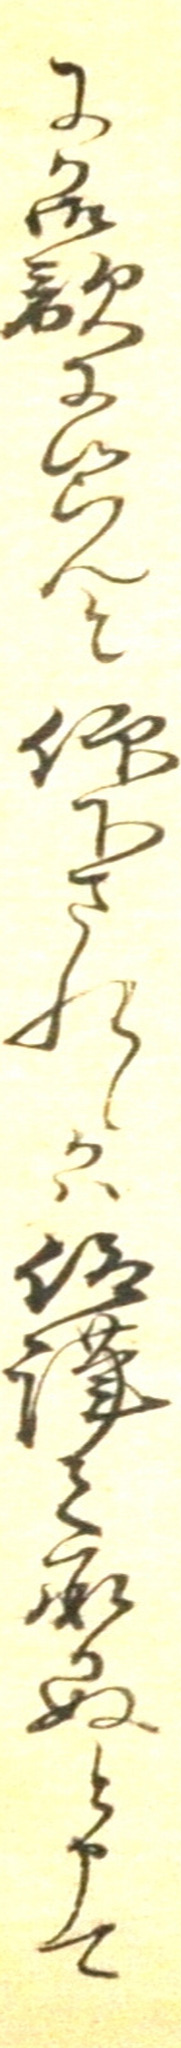にか御敵に候はんと仰下されしかは仰謹て承りぬと申て
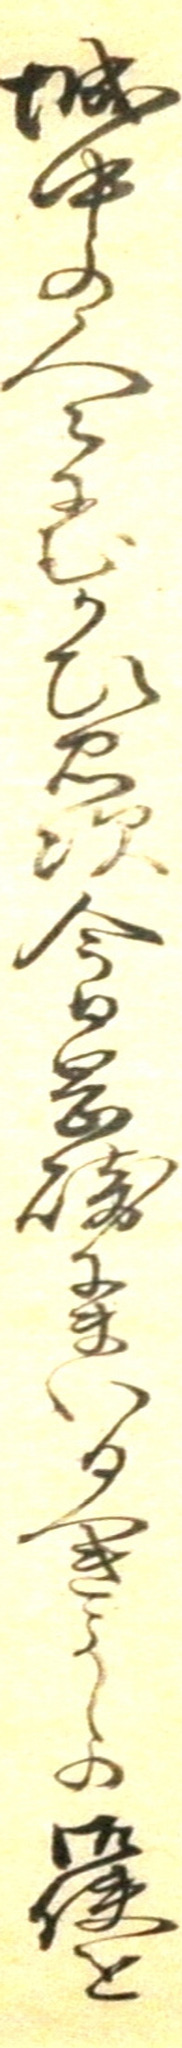城中の人々にむかひ忠次今日岡崎にまいるへきよしの御使を
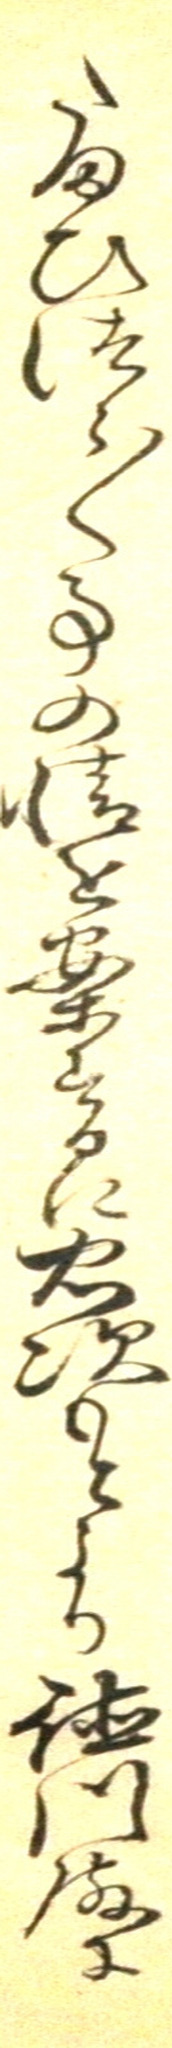たまひつら〳〵事の情を案するに忠次もとより徳川殿に
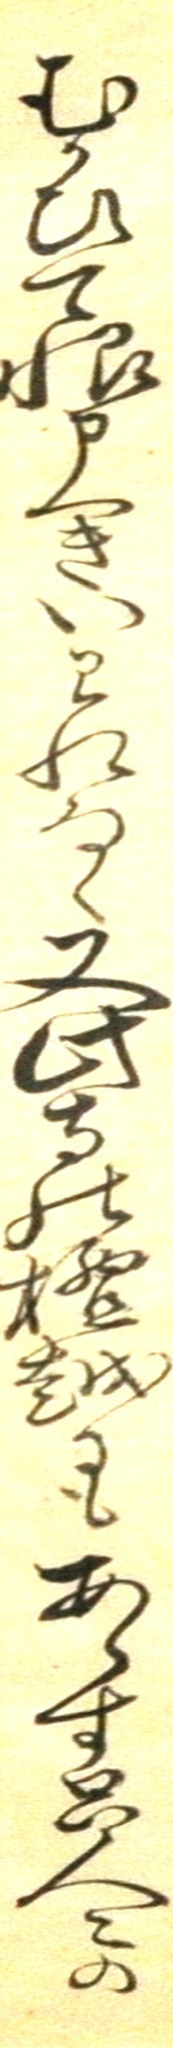むかひて恨申へきいわれなく又此寺の檀越にもあらす只人々の
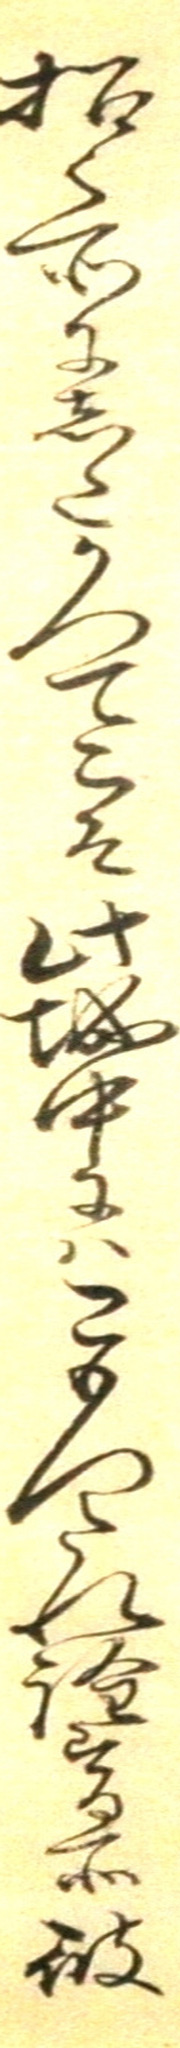招く所にしたかつてこそ此城中にはこもつたれ詮する所彼
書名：藩翰譜（四・下）
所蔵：伊那市立高遠町図書館・合同会社AMANE
